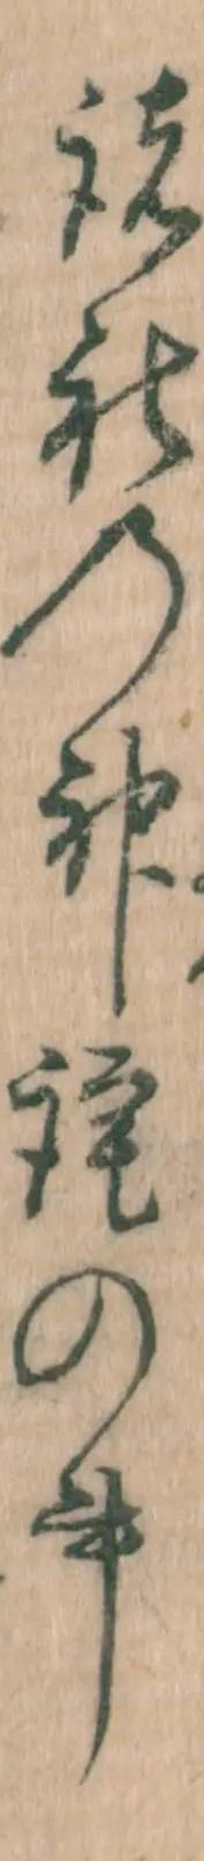二諸社の神託の事
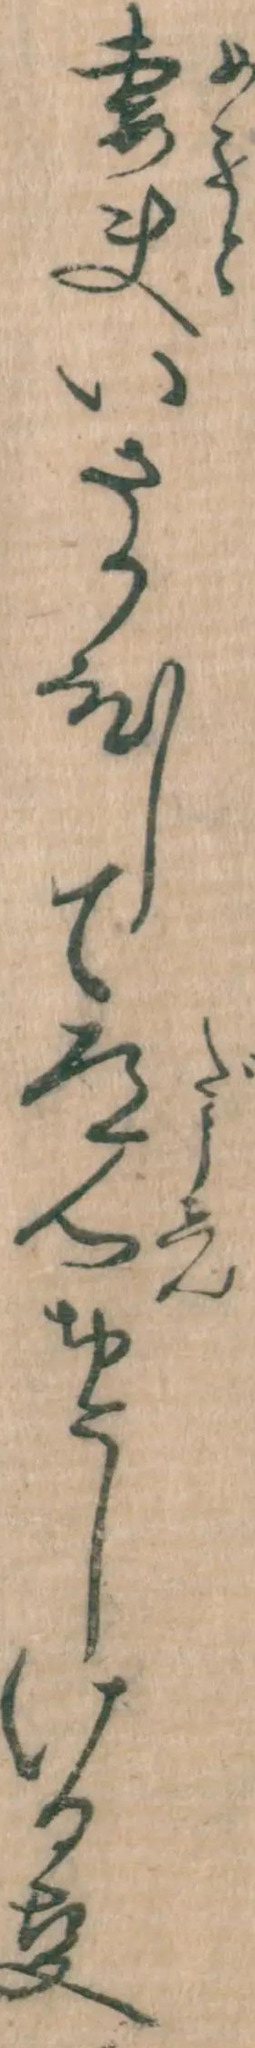三妻夫いさかひして道心おとしける事
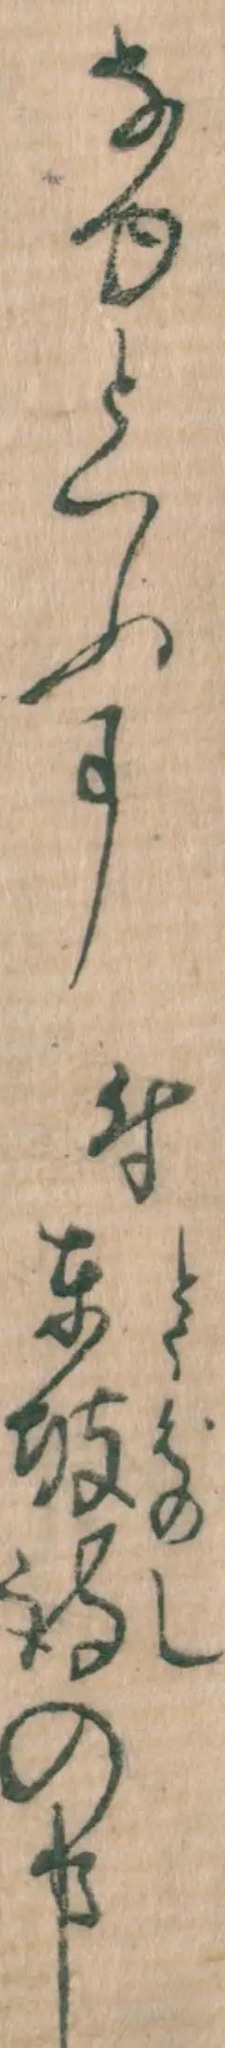四なゆといふ事付東坡詩の事

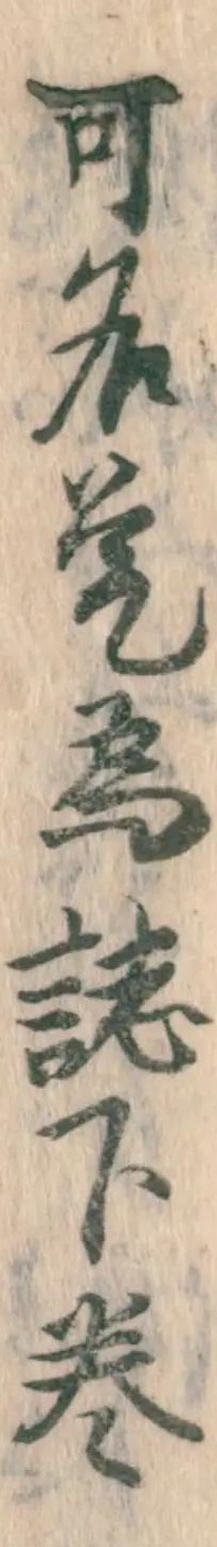可名覚為誌下巻
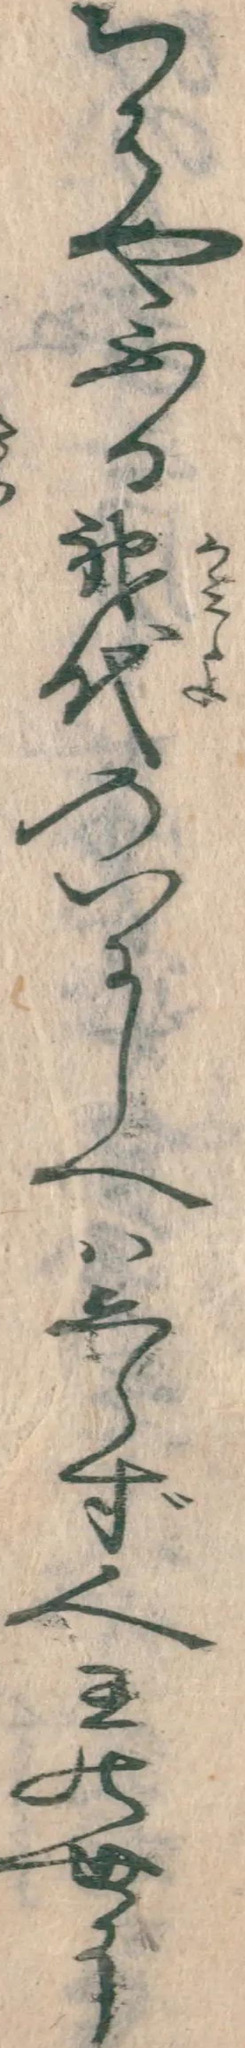ちはやふる神代のいにしへはしらず人王の世に
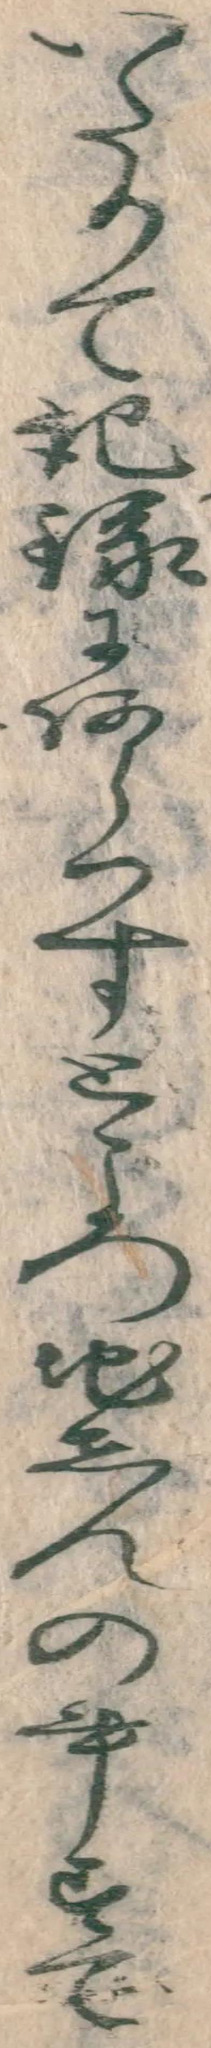いたりて記録にあらはすところ地しんの事すで
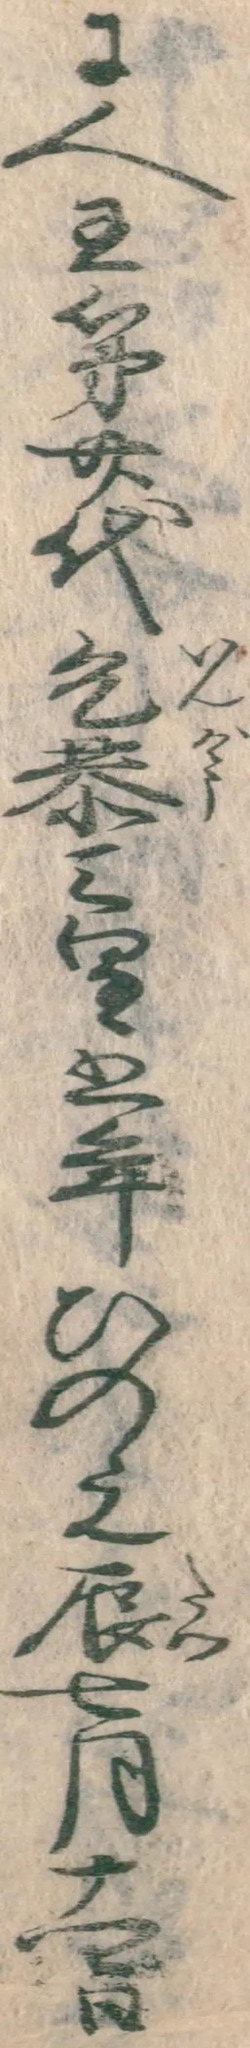に人王第廿代允恭天皇五年ひのえ辰七月十四日
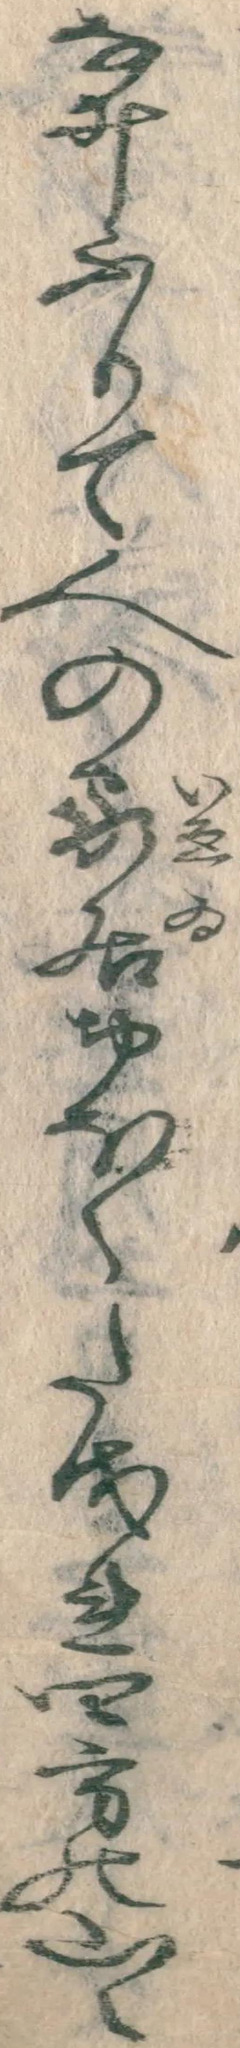なゐふりて人の家居おほくたをれ四方の山々
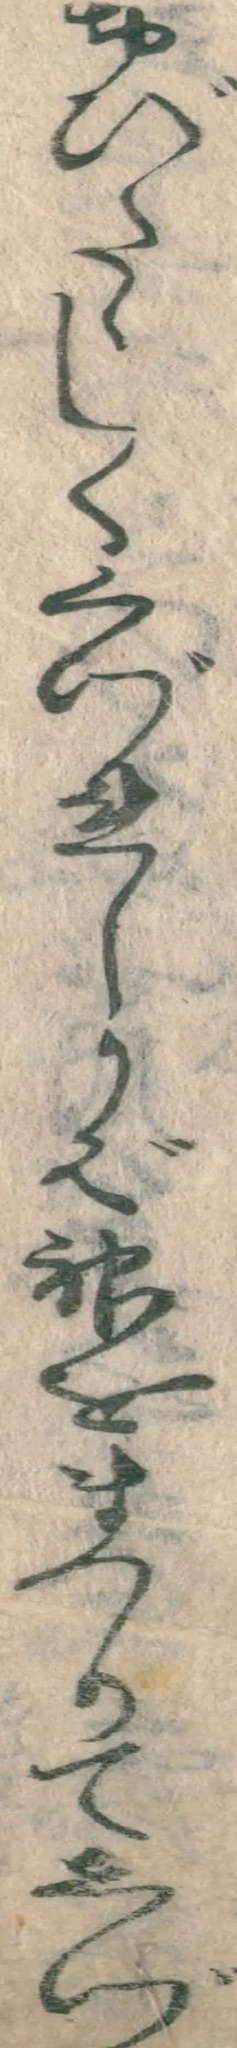おびたゝしくくづれしかば神をまつりてしづ
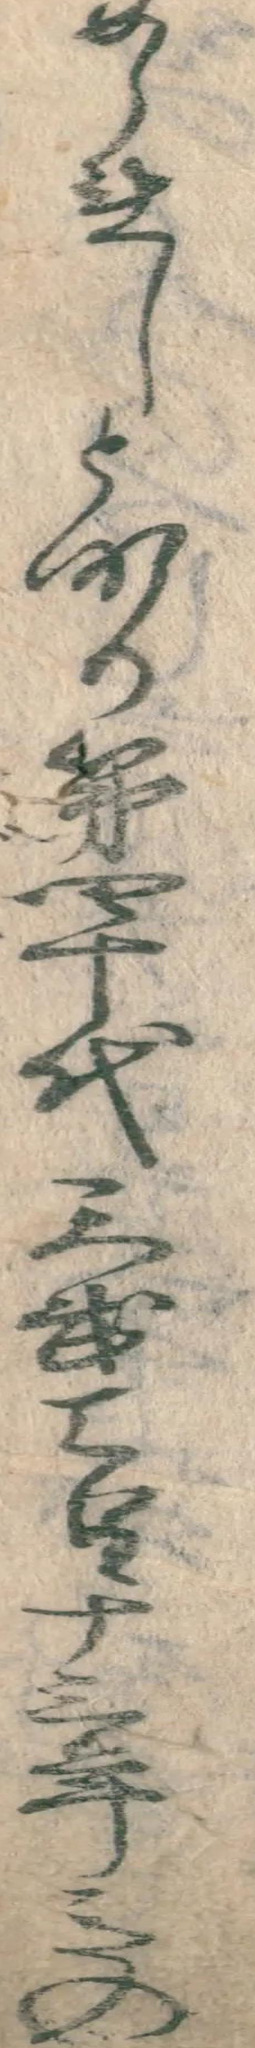められしとなり第四十代天武天皇十三年きの
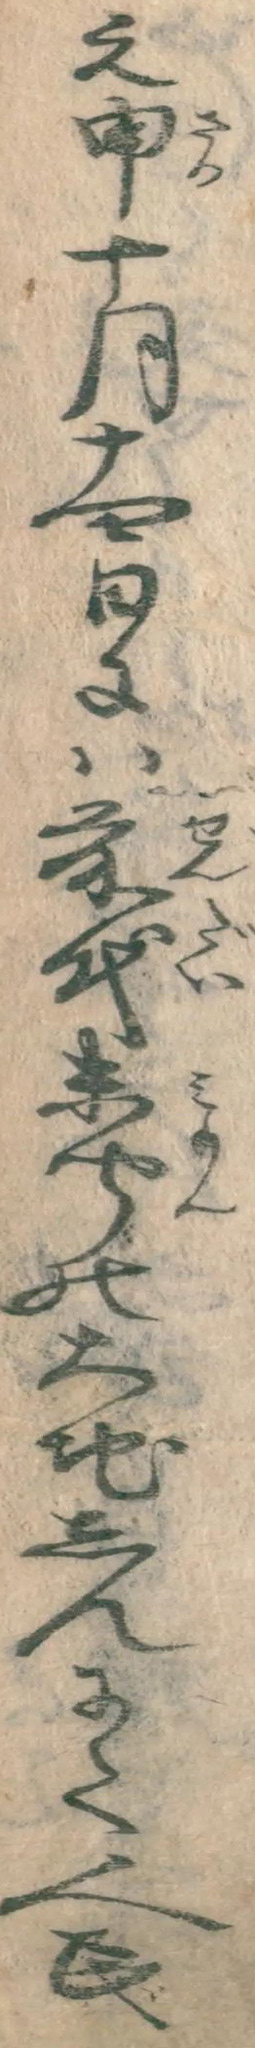え申十月十四日には前代未聞の大地しんにて人民

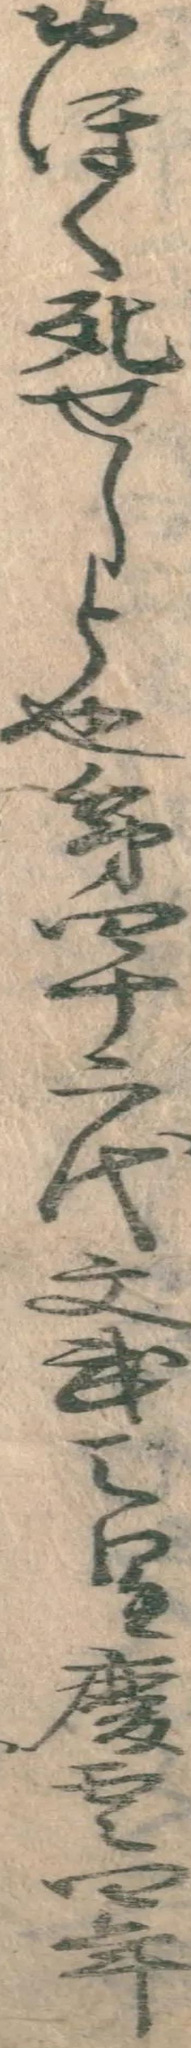おほく死せしと也第四十二代文武天皇慶雲四年
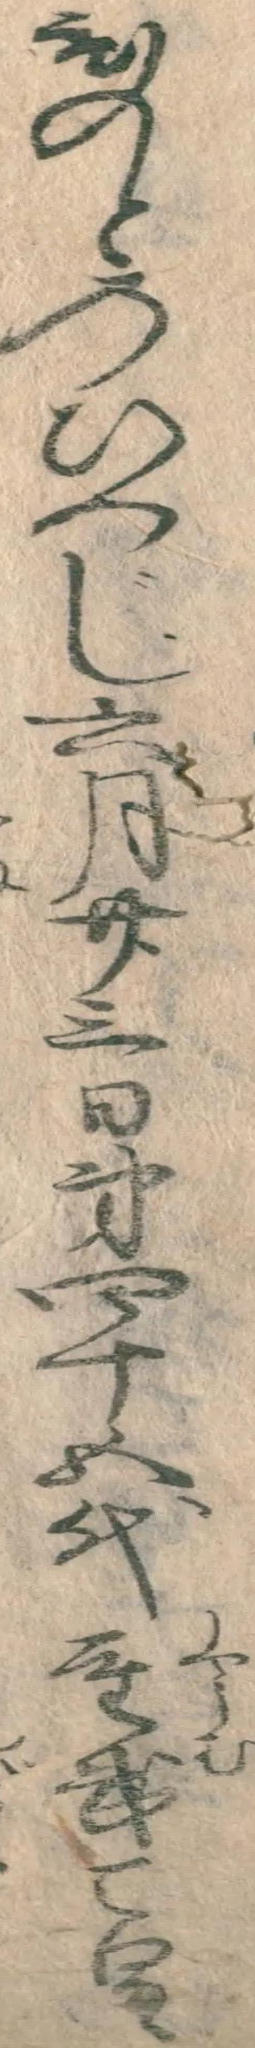ひのとのひつじ六月廿三日第四十五代聖武天皇
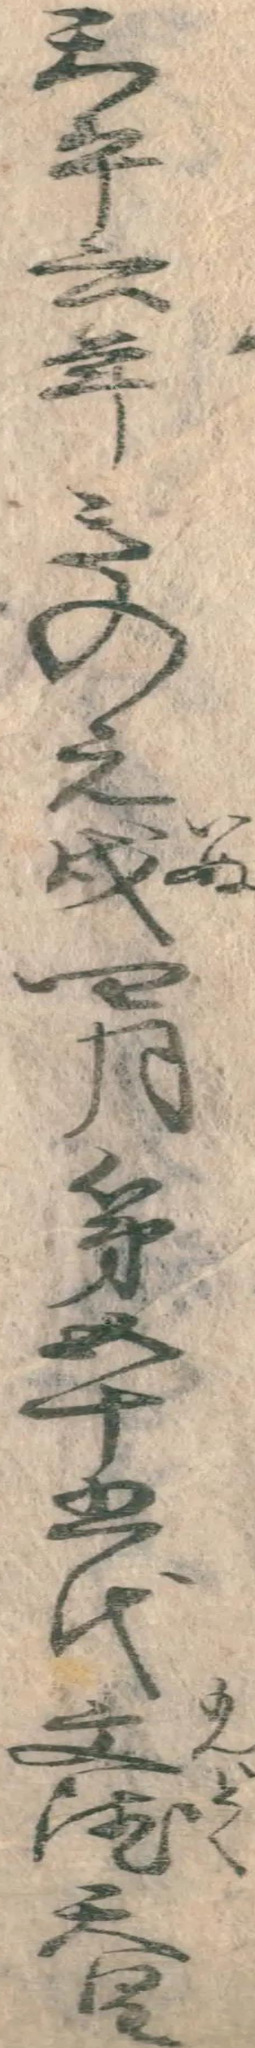天平六年きのえ戌四月第五十五代文徳天皇
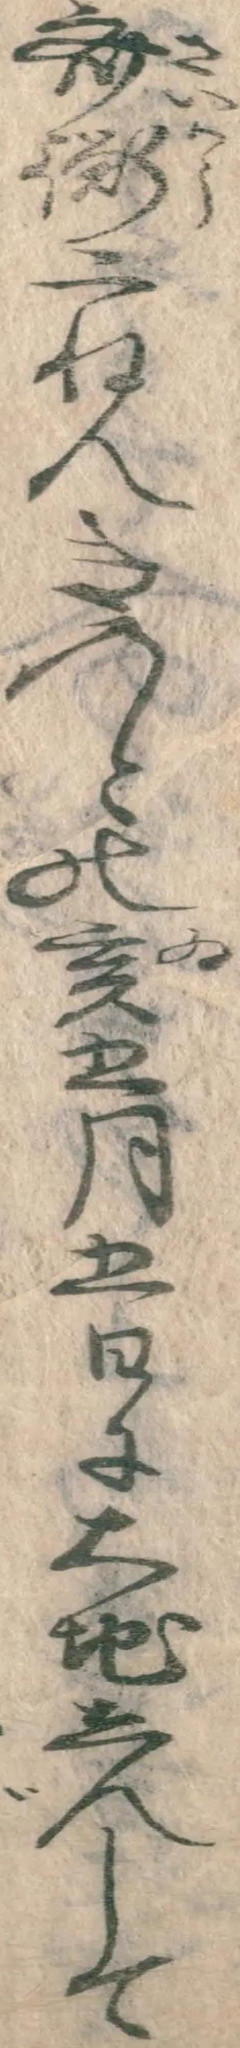斎衡ニねんきのとの亥五月五日に大地しんして
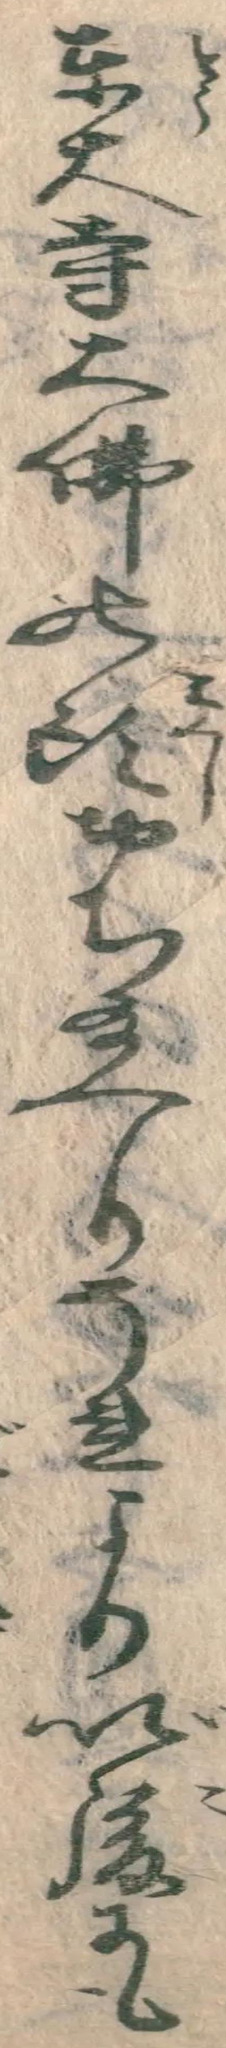東大寺大佛の頭おち給へりそれより以後にも
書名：艱難目異志. 上,下
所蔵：国立国会図書館 National Diet Library, JAPAN
